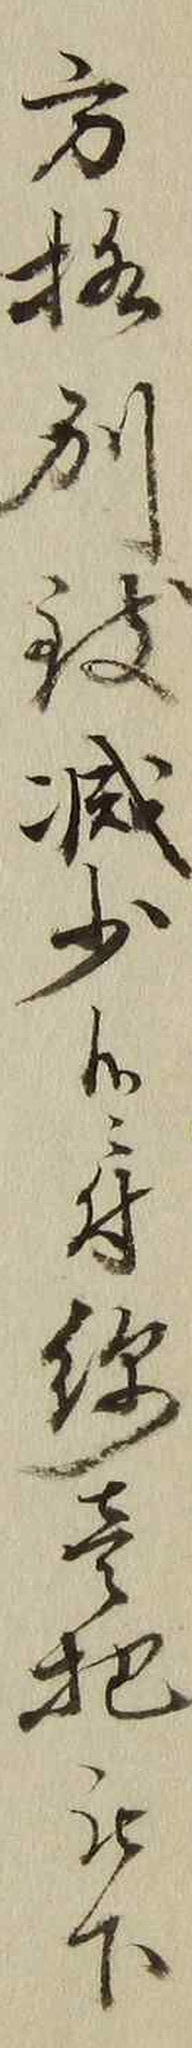方格別致減少候ニ付綿壱把被下
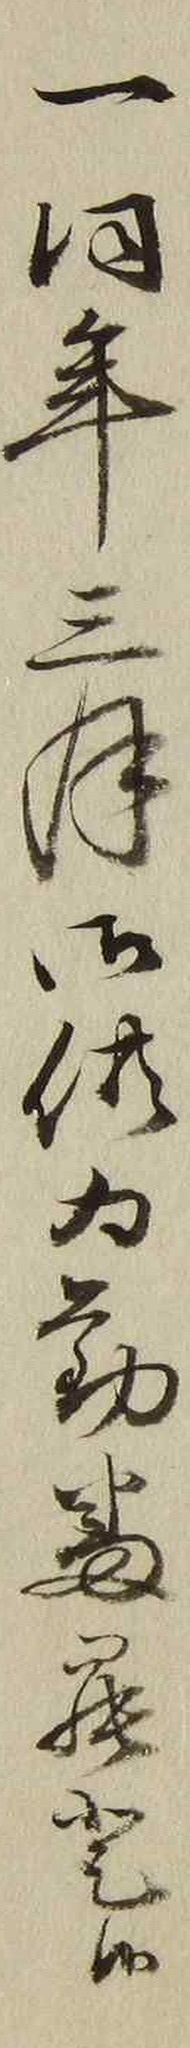一同年三月御供為勤番罷登候
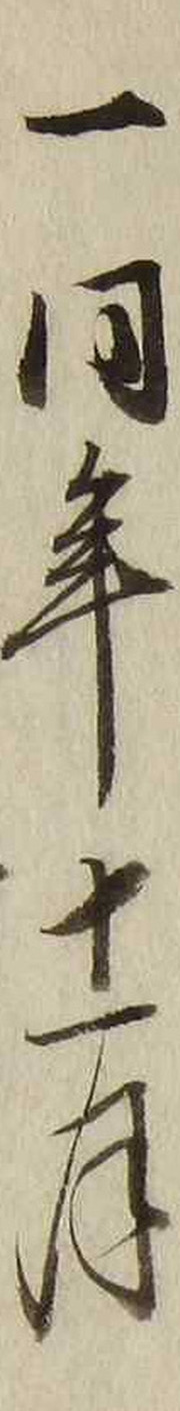一同年十一月
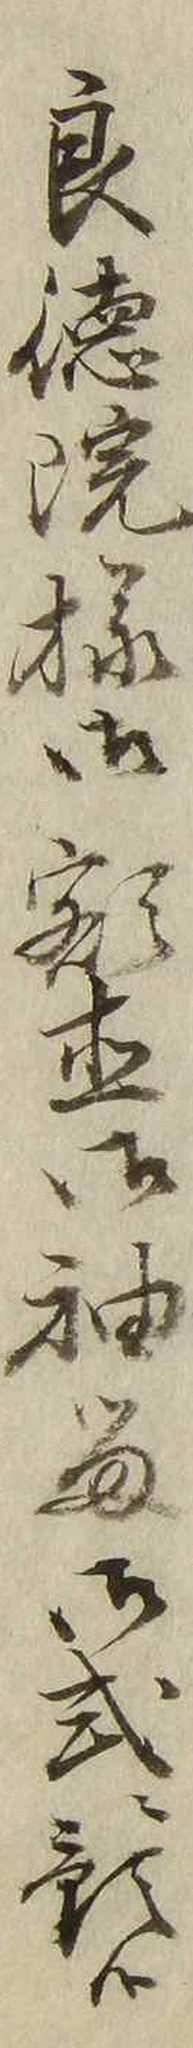良徳院様御額直御袖留御式ニ預候

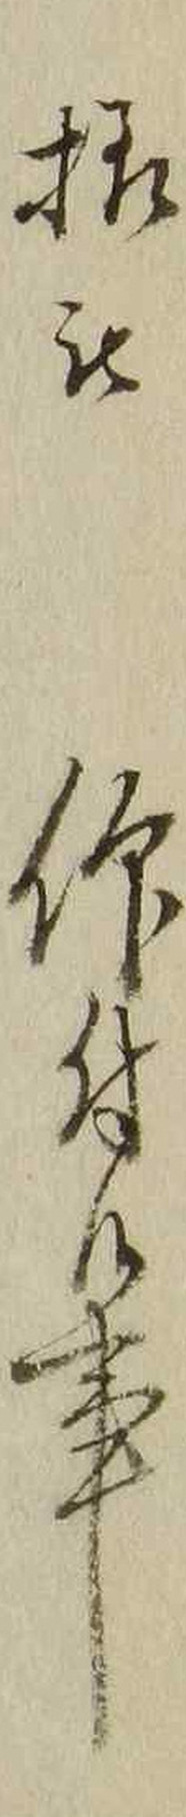様被仰付候事
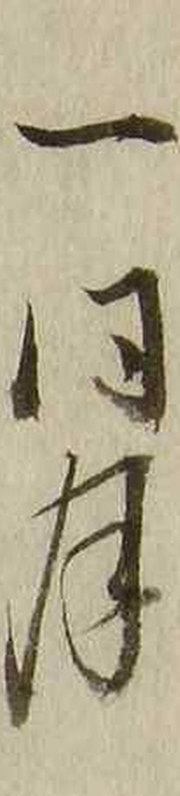一同月
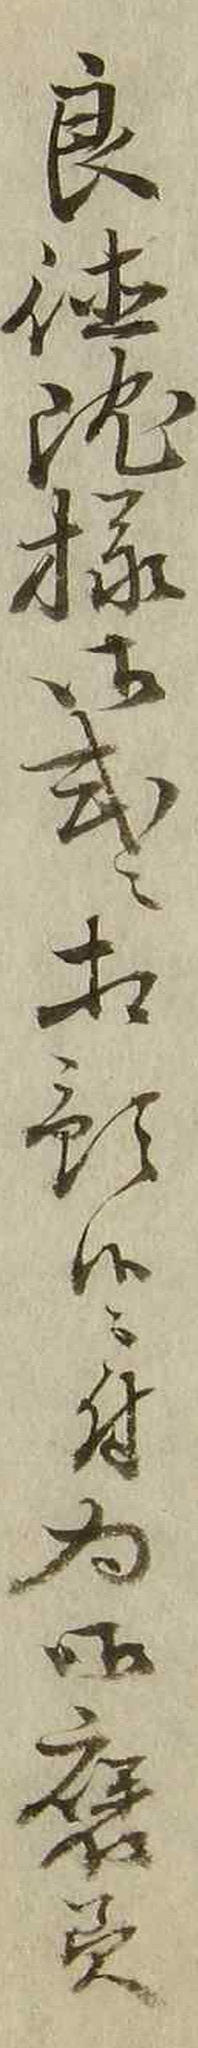良徳院様御式ニ相預候ニ付為御褒美
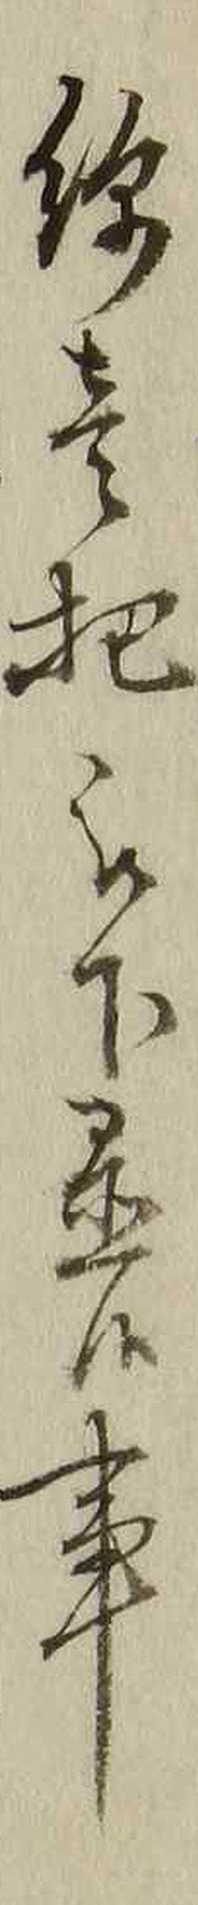綿壱把被下置候事
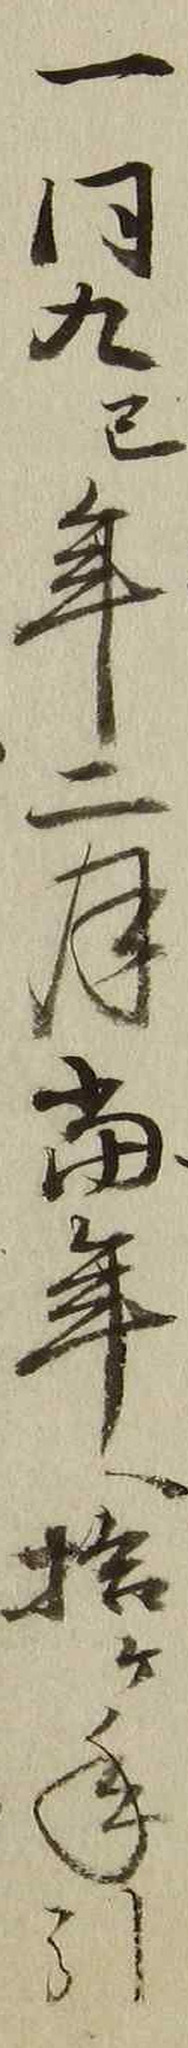一同九巳年二月当年へ拾ヶ年引
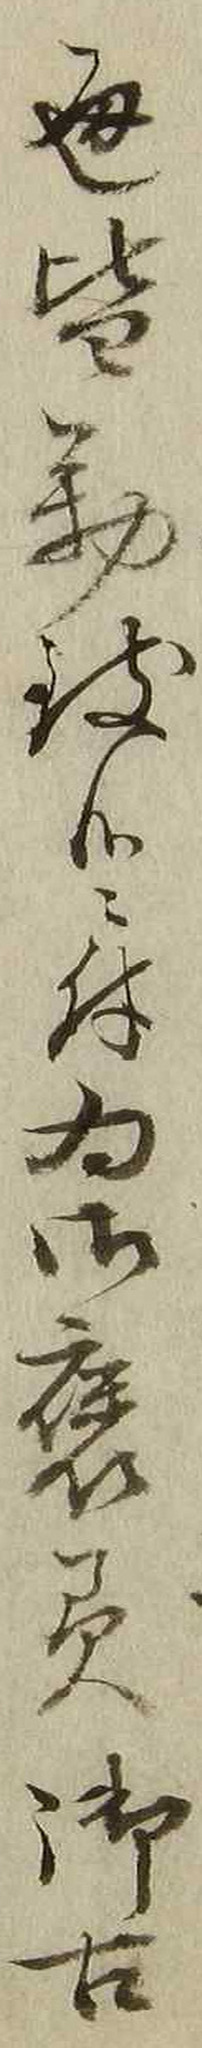通皆勤致候ニ付為御褒美御古
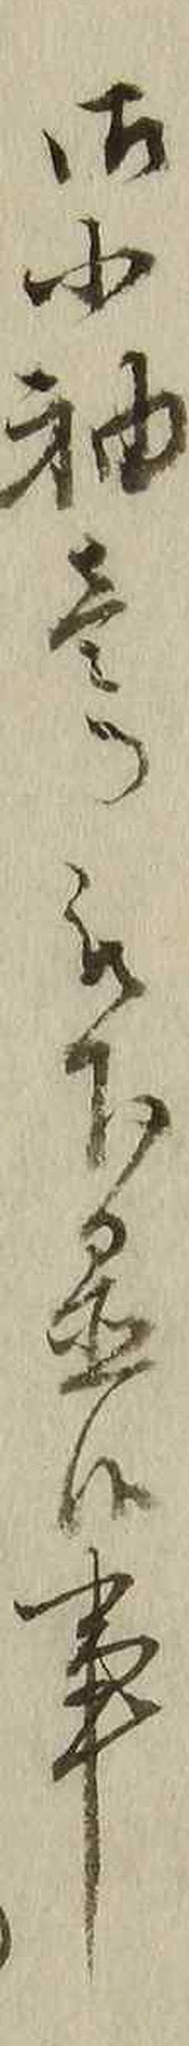御小袖壱ツ被下置候事
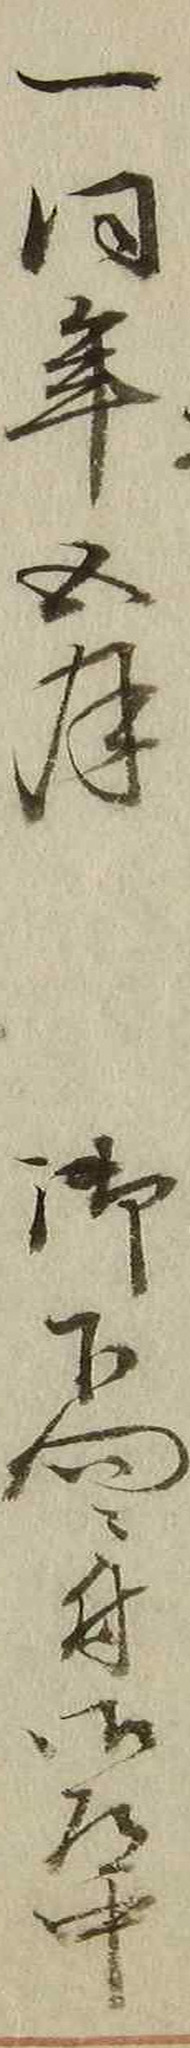一同年五月御下向ニ付御道中
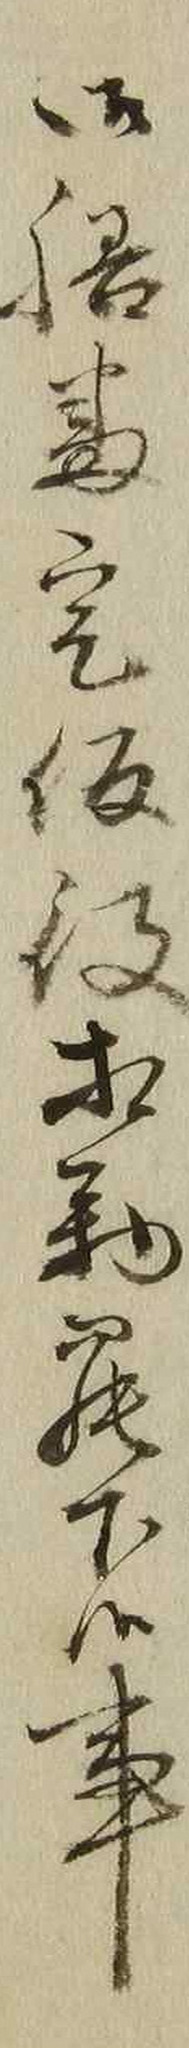御膳番定仮役相勤罷下候事
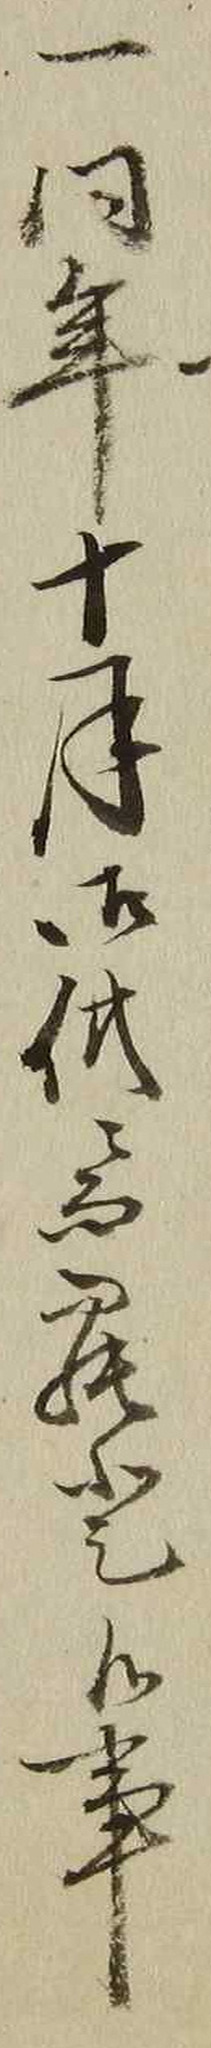一同年十月御供ニ而罷登候事
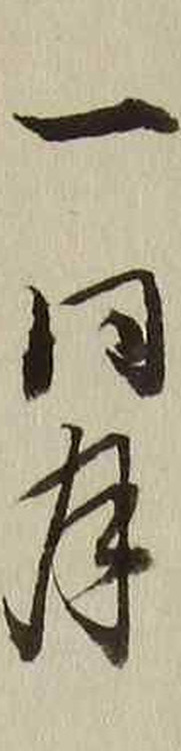一同月
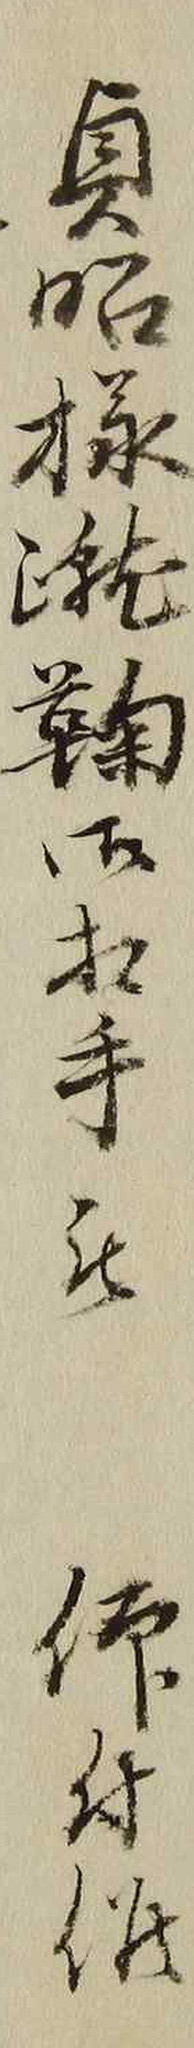貞昭様蹴鞠御相手被仰付候
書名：諸士系譜　巻之36　は之部4
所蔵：会津若松市立会津図書館
